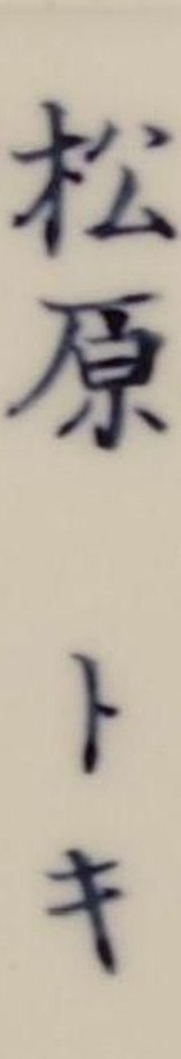松原トキ
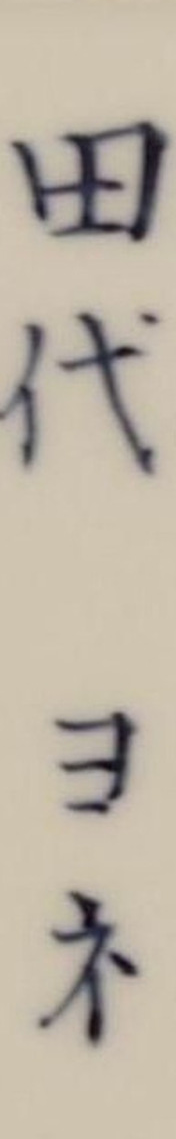田代ヨネ
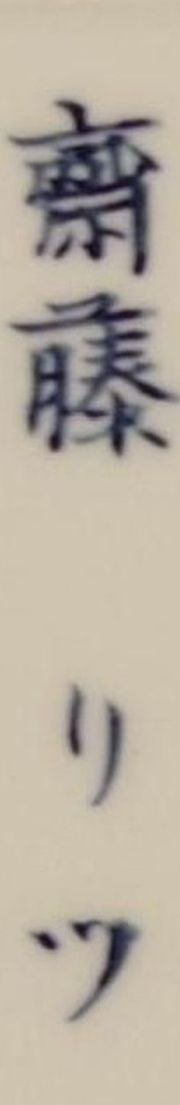齋藤リツ
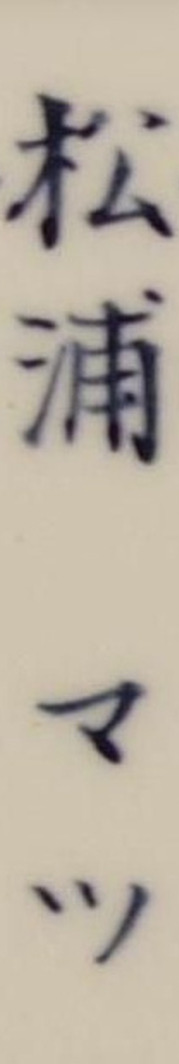松浦マツ
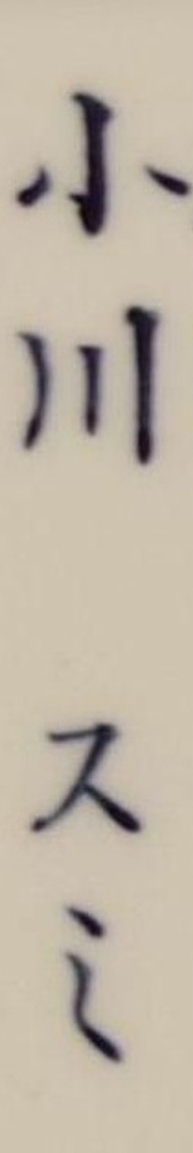小川スミ
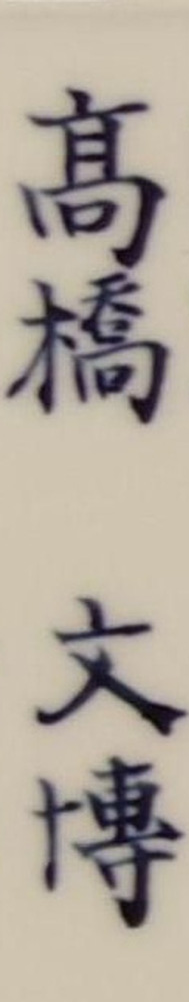高橋文博
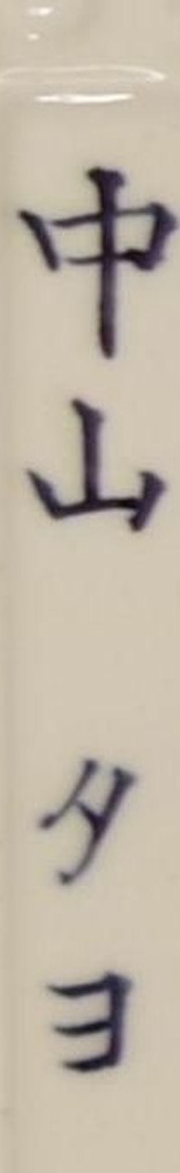中山タヨ

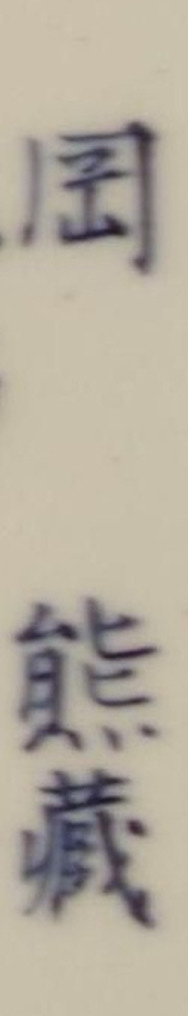岡熊蔵
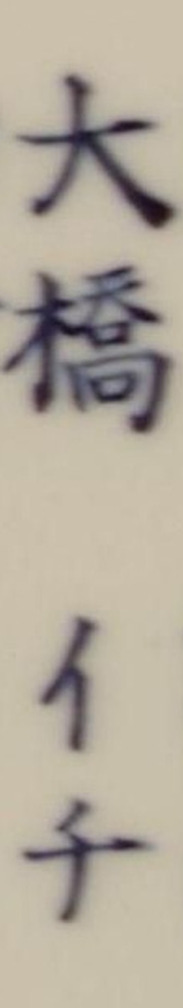大橋イチ
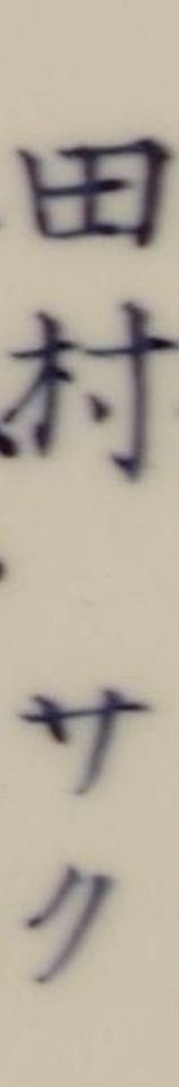田村サク
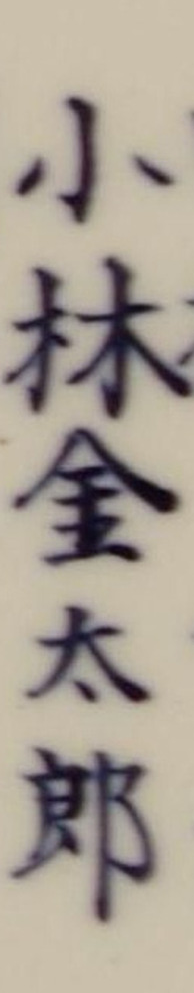小林金太郎
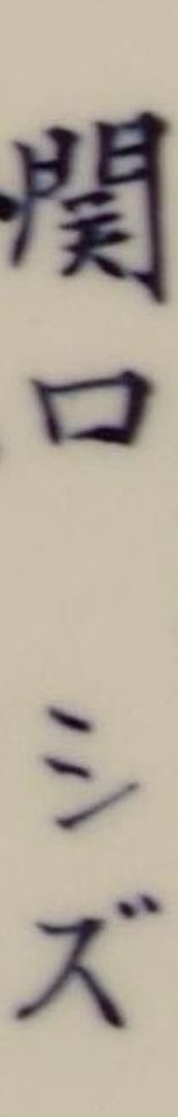関口シズ
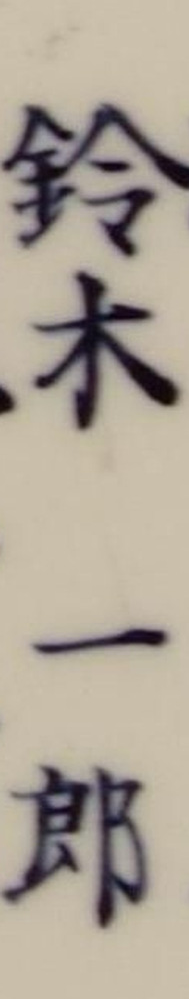鈴木一郎
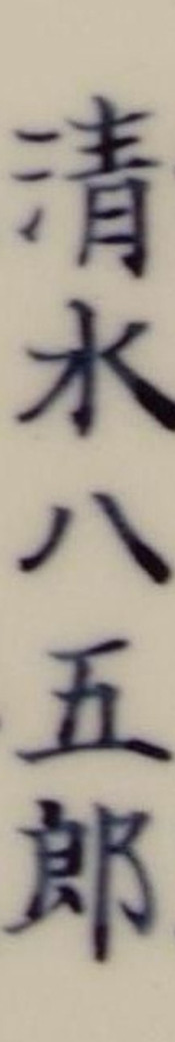清水八五郎
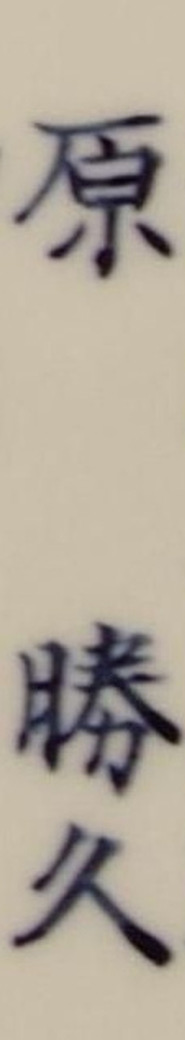原勝久
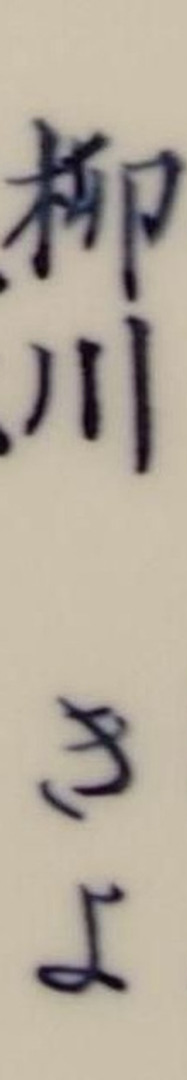柳川きよ
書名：M~S
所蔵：高野山金剛峯寺
